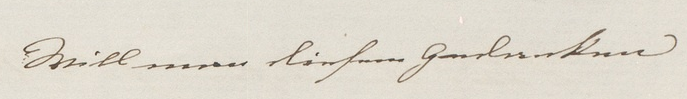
Will man diesem Gedanken
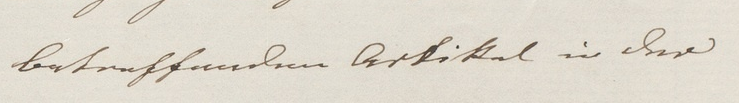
betreffenden Artikel in der
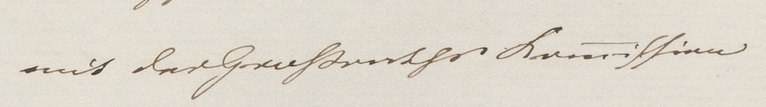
mit der Großraths Kommission
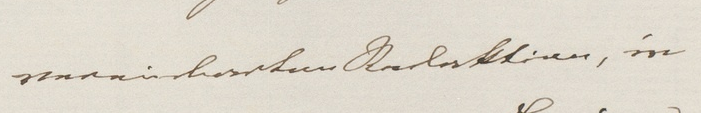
vereinbarten Redaktion, in
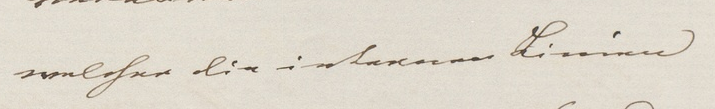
welcher die internen Linien
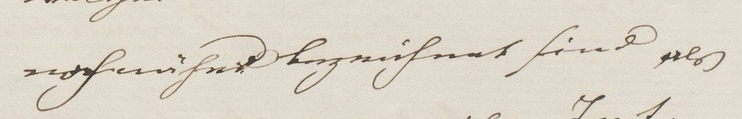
noch näher bezeichnet sind, als
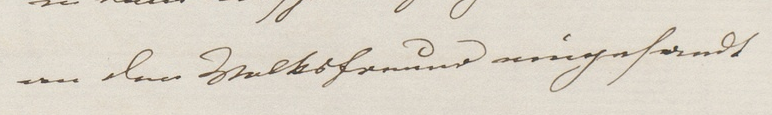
an den Volksfreund eingesandt
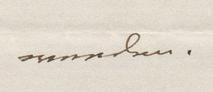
werden.
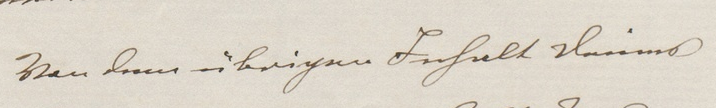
Von dem übrigen Inhalt Deines
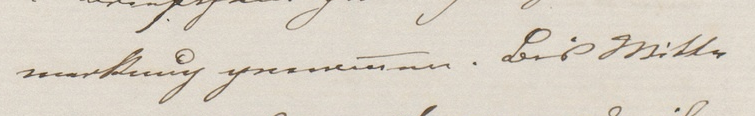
merkung genommen. Bis Mitt-
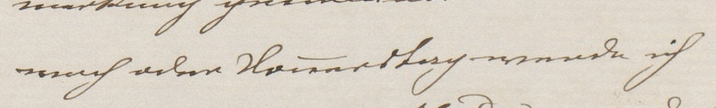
woch oder Donnerstag werde ich
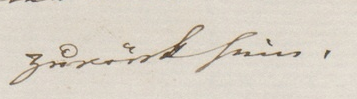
zurück sein.
